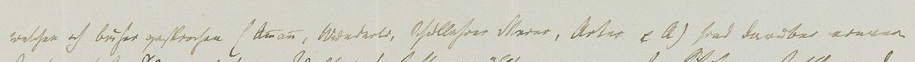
welchen ich bisher gesprochen (Ammann, Wunderli, Schullehrer Meier, Arter uA) sind darüber einver-
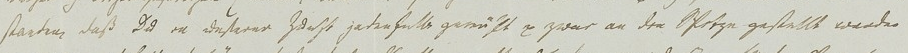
standen, daß Du in unserer Zunft jedenfalls gewählt & zwar an die Spitze gestellt werden
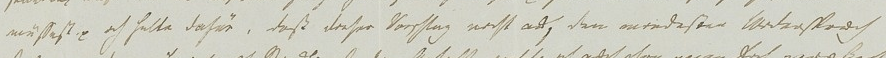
müssest & ich halte dafür, daß dieser Vorschlag nicht auf den mindesten Widerspruch
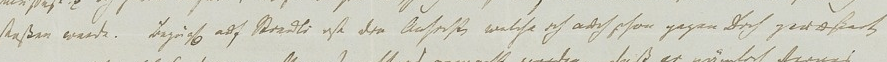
stoßen werde. Bezüglich auf Streuli ist die Ansicht, welche ich auch schon gegen Dich geäußert,
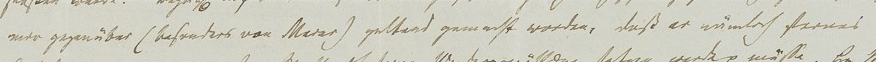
mir gegenüber (besonders von Meier) geltend gemacht worden, daß er nämlich seines
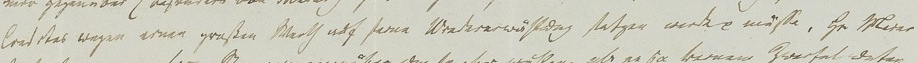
Credites wegen einen großen Werth auf seine Wiedererwählung setzen werde & müsse, Hr Meier
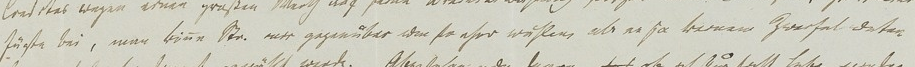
fügte bei, man könne Str. mir gegenüber um so eher wählen, als es ja keinem Zweifel unter-
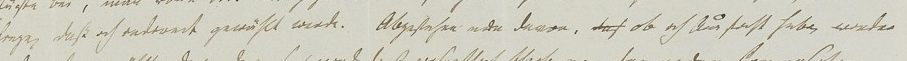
liege, daß ich indirect gewählt werde. Abgesehen nun davon, das ob ich Aussicht habe, wieder
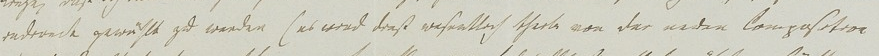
indirect gewählt zu werden (es wird dieß wesentlich theils von der neuen Composition
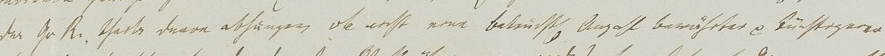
des GrR. theils davon abhängen, ob nicht eine beträchtliche Anzahl bewährter & tüchtigerer
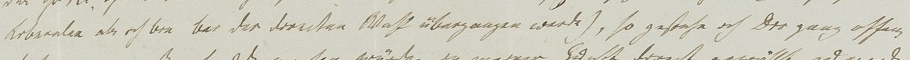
Liberaler als ich bin bei der directen Wahl übergangen werde), so gestehe ich Dir ganz offen,
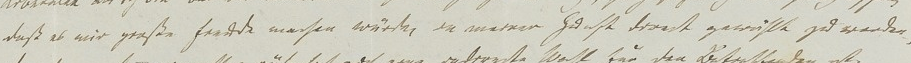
daß es mir große Freude machen würde, in meiner Zunft direct gewählt zu werden;
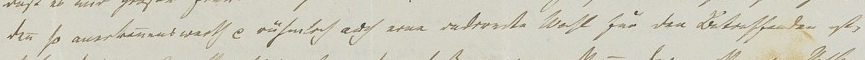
denn so anerkennenswerth & rühmlich auch eine indirecte Wahl für den Betreffenden ist,
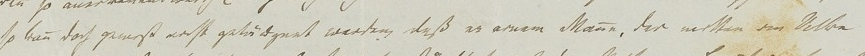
so kann doch gewiß nicht geläugnet werden, daß es einem Manne, der mitten im Volke
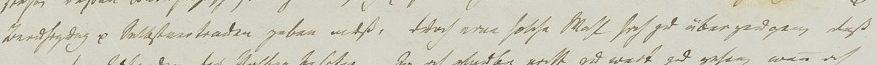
Beruhigung & Selbstvertrauen geben muß, durch eine solche Macht sich zu überzeugen, daß
